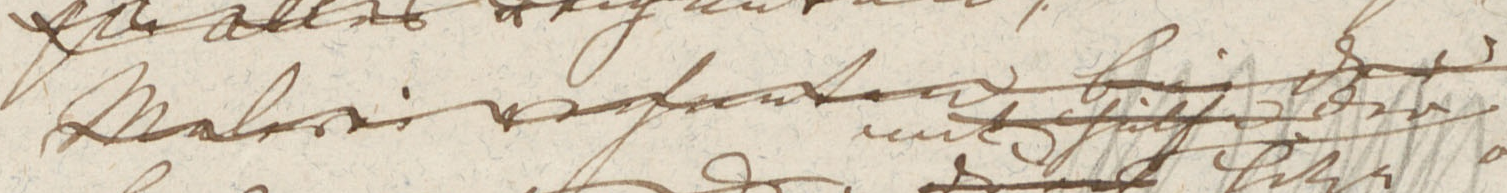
Malerei rechneten bei der die
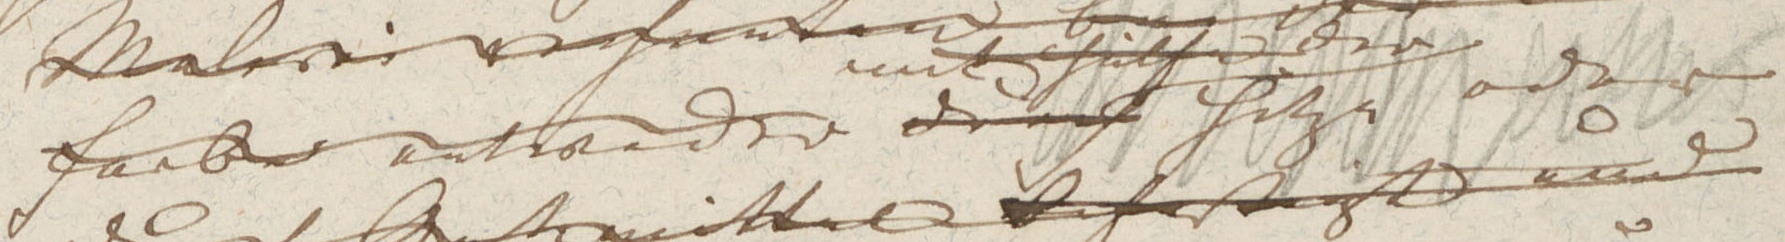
Farbe entweder durch mit Hülfe der
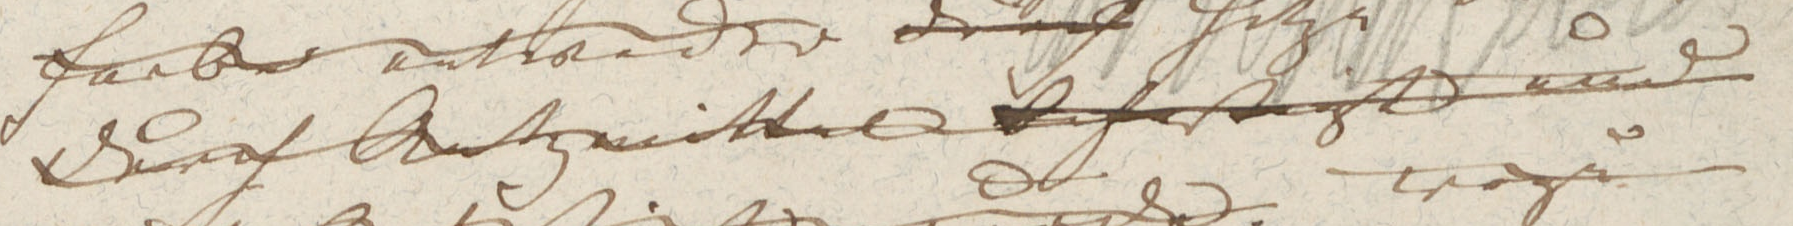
durch Aetzmittel befestigt und
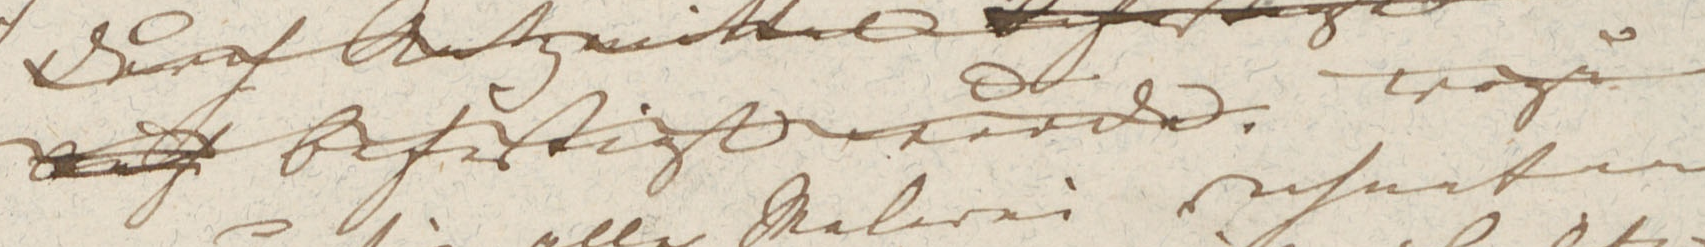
auf befestigt wurde. wozu
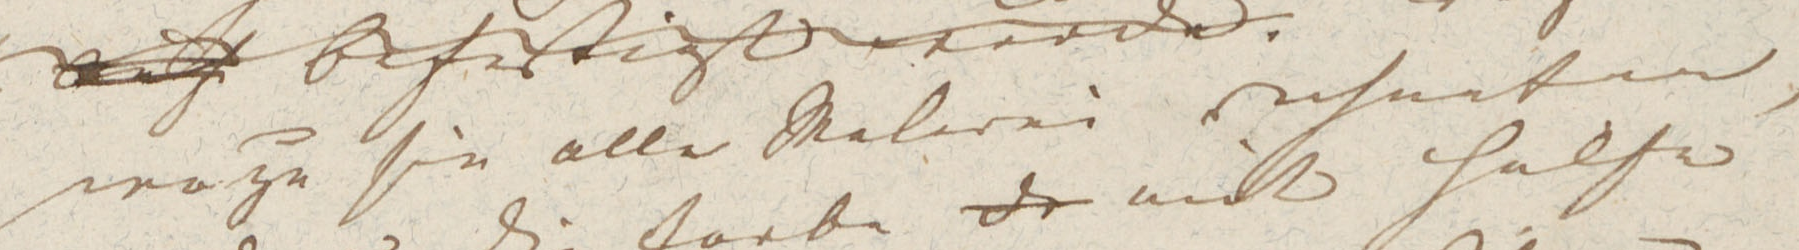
wozu sie alle Malerei rechneten,
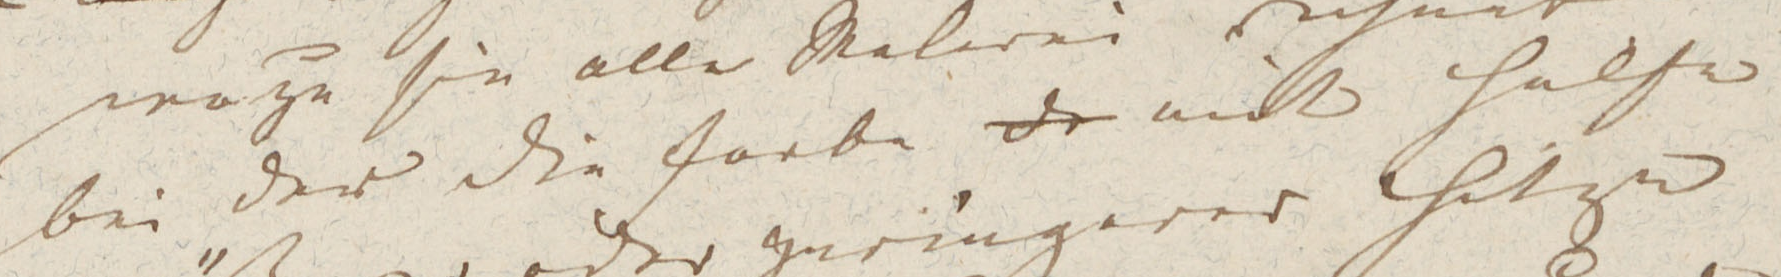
bei der die Farbe d mit Hülfe
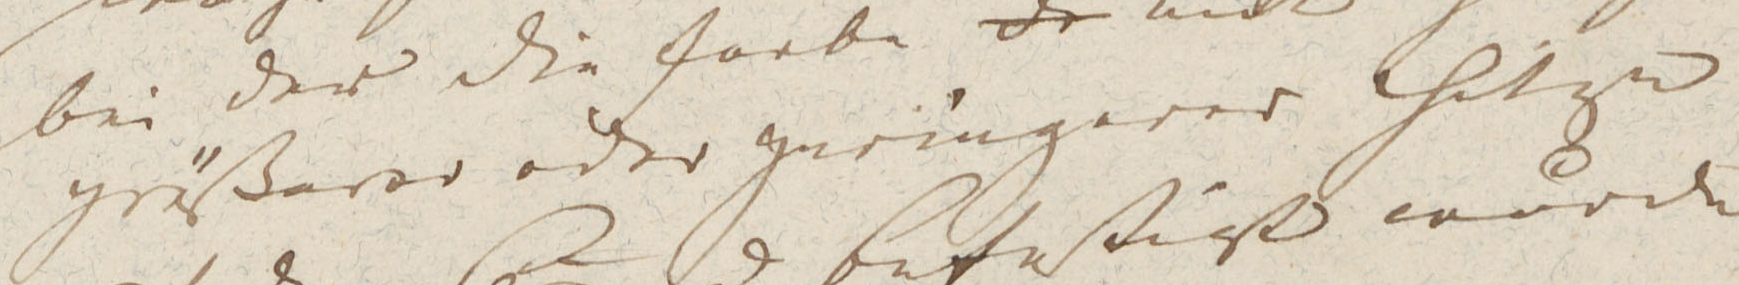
grösserer oder geringerer Hitze
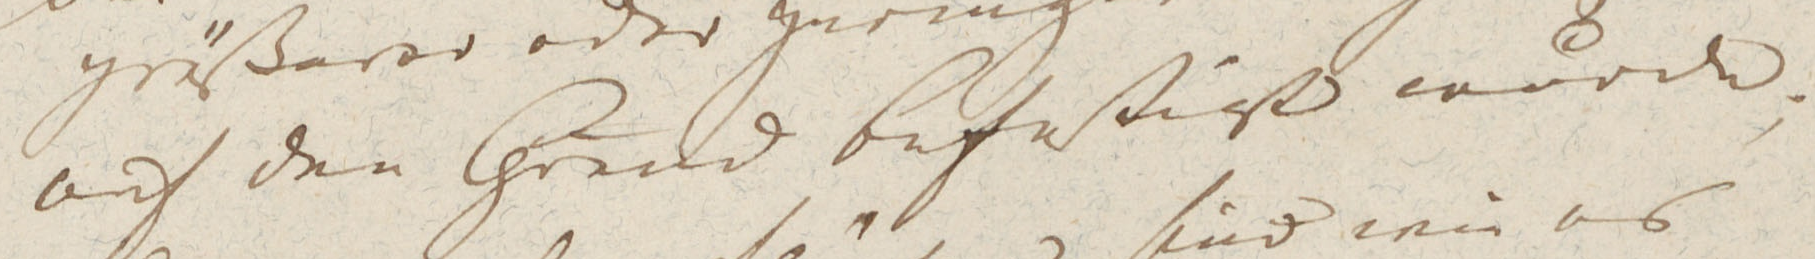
auf den Grund befestigt wurde;
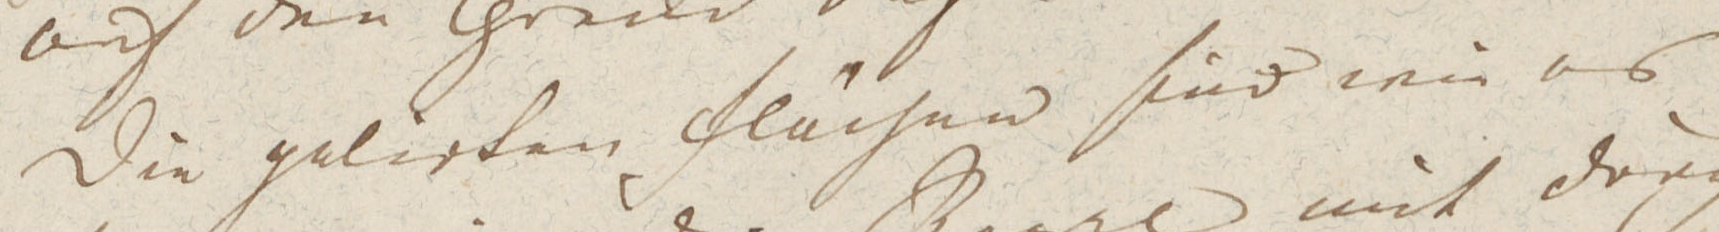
Die polirten Flächen sind wie es
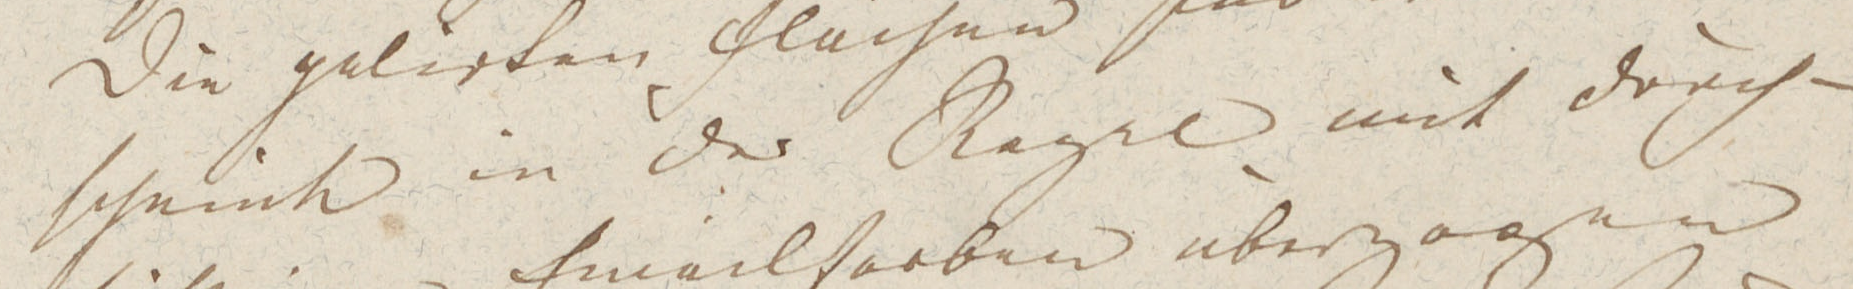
scheint in der Regel mit durch-
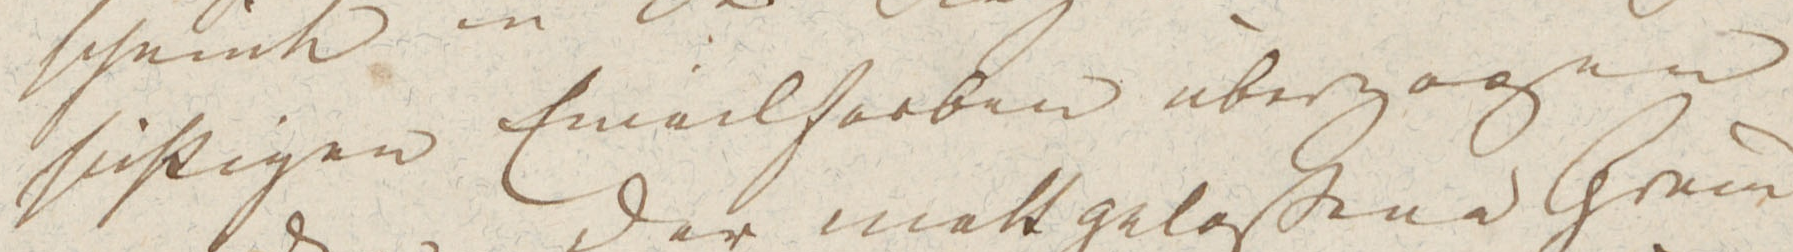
sichtigen Emailfarben überzogen
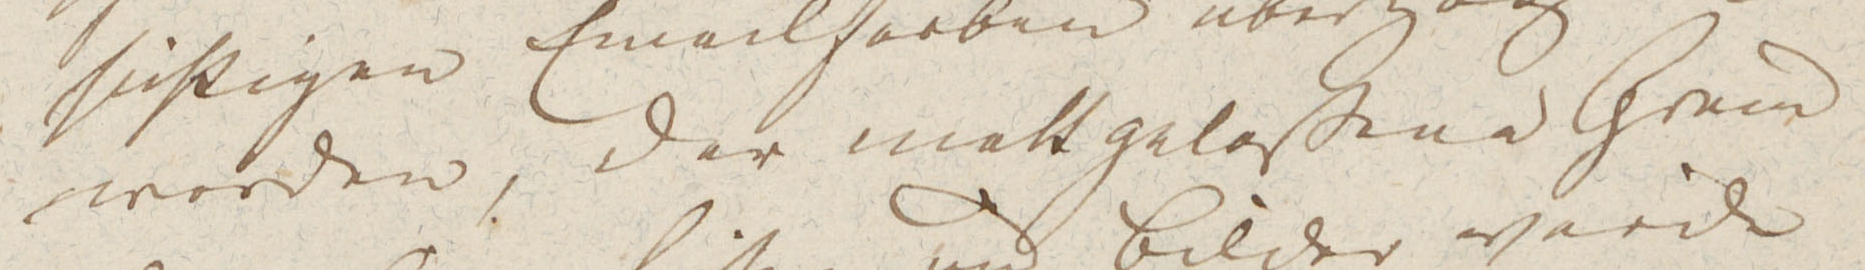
worden, der matt gelassene Grund
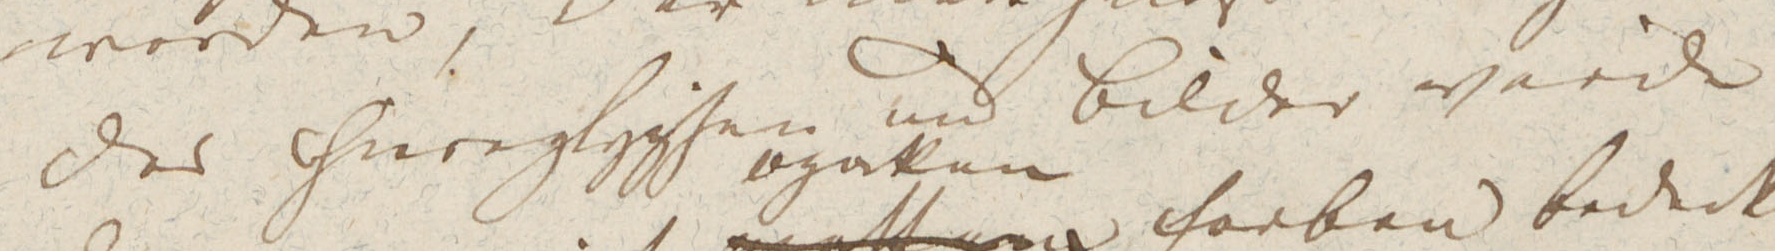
der Hieroglyphen und Bilder wurde
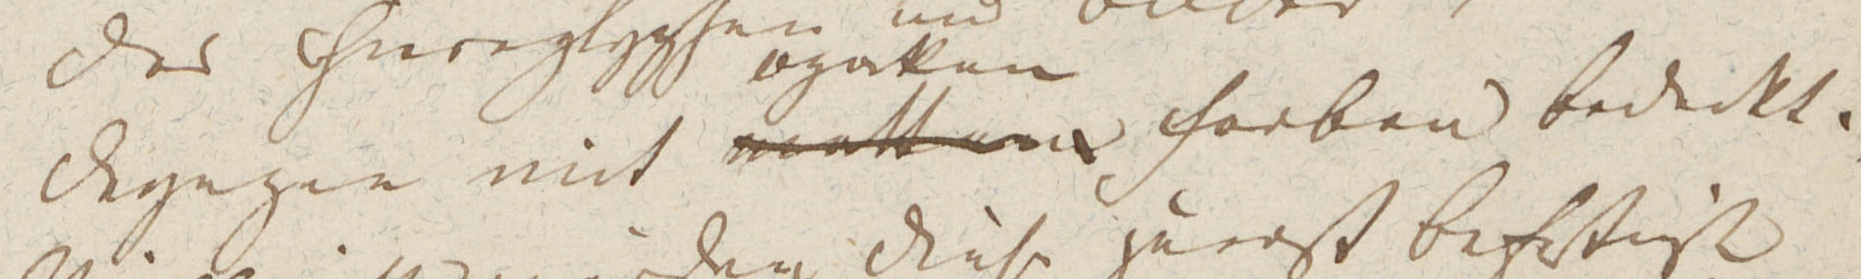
dagegen mit matten opaken Farben bedeckt.
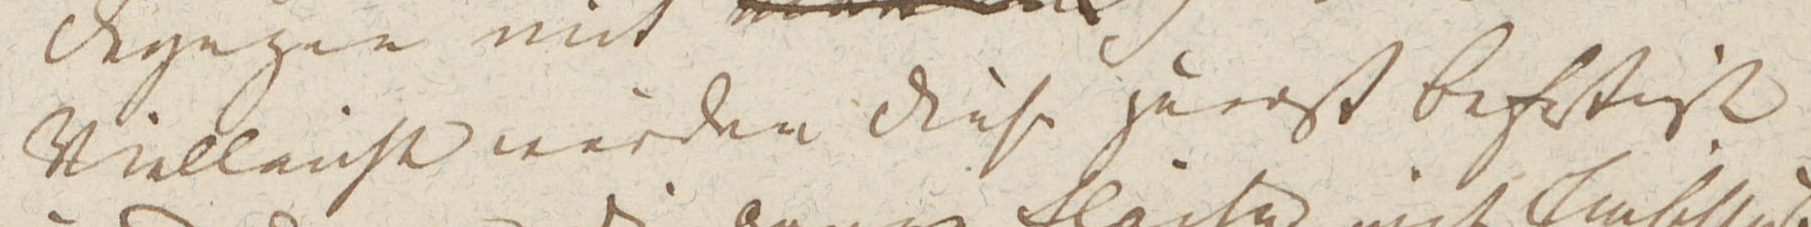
Vielleicht wurden diese zuerst befestigt
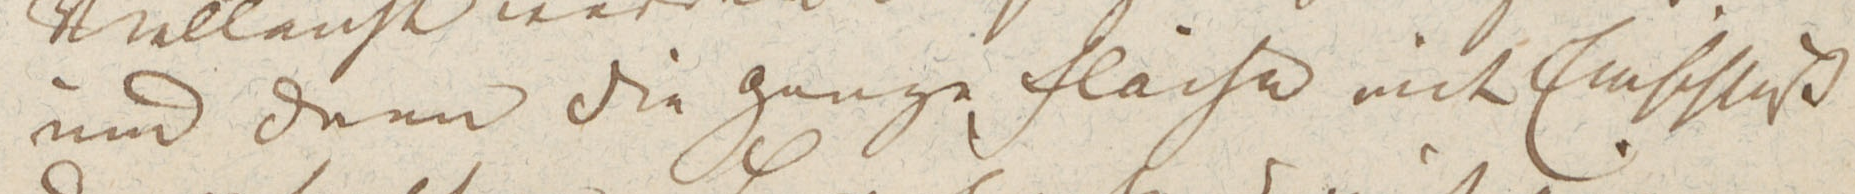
und dann die ganze Fläche mit Einschluss
